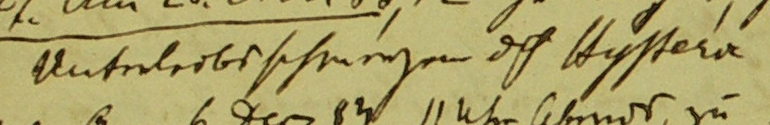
Blumenzeilechmerzen durch Hysterie
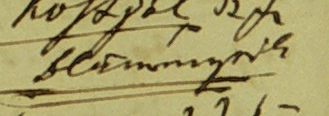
Blumenzeile
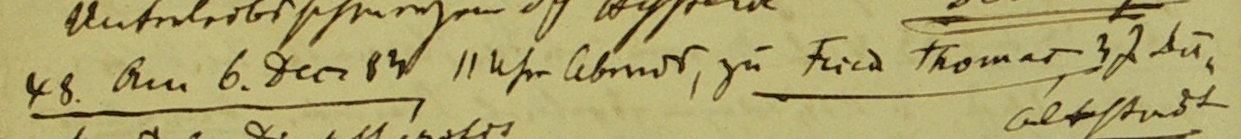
48. Am 6. Dez. 83, 11 Uhr Abends, zu Frid. Thomas 3 J.
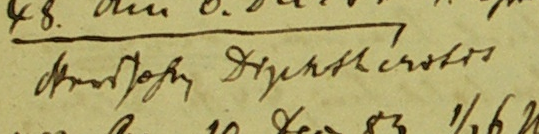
Adv. Sohn Diphterotos
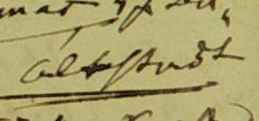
Altstadt
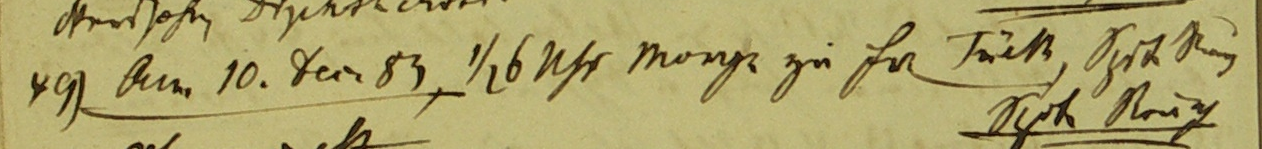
49. Am 10. Dez. 83, ½ 6 Uhr Morg. zu Fr. Türk, Spit. Ring
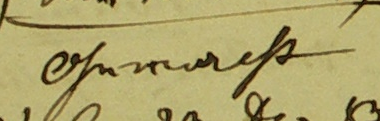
Ohnmacht
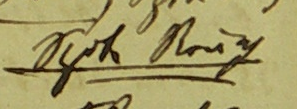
Spit Ring
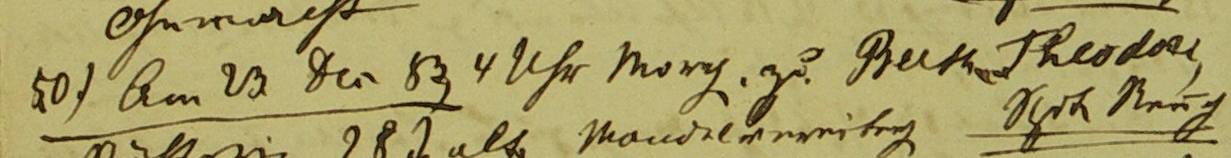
50. Am 23. Dez. 83, 4 Uhr Morg. zu Bertha Theodora,
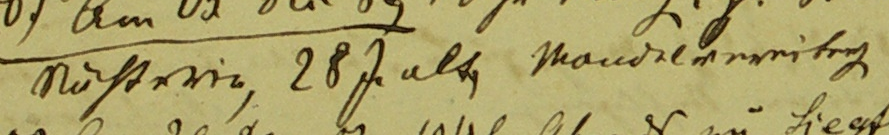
Näherin, 28 J. alt Mandelvereiterung
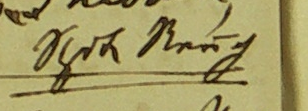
Spit Ring
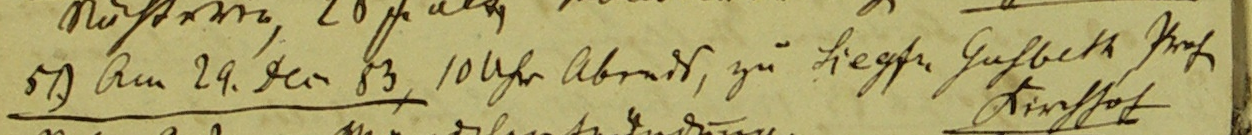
51. Am 29. Dez, 83, 10 Uhr Abends, zu Siegfr. Gusbeth, Prof.
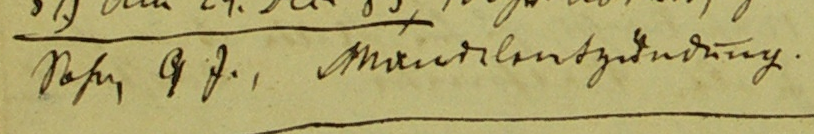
Sohn 9 nJ. Mandelentzündung
